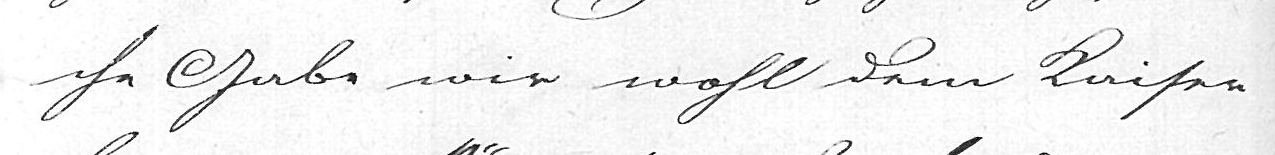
che Gabe wir wohl dem Kaiser
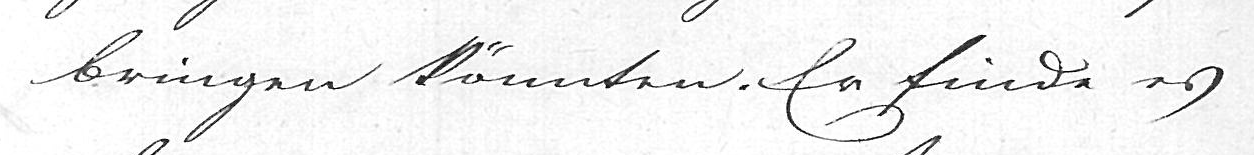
bringen könnten. Er finde es
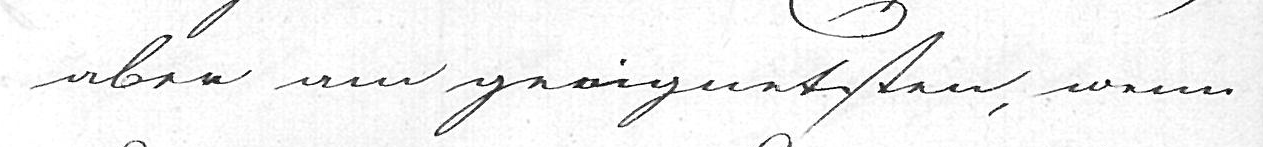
aber am geeignetsten, wenn
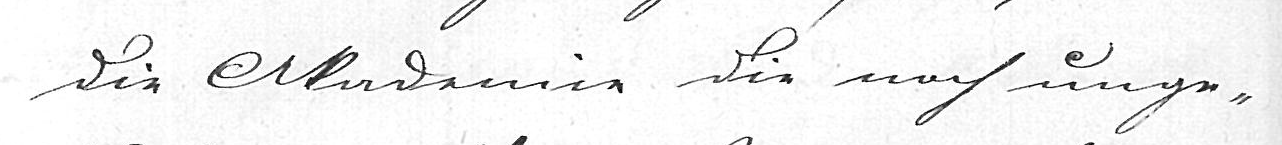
die Akademie die noch unge-
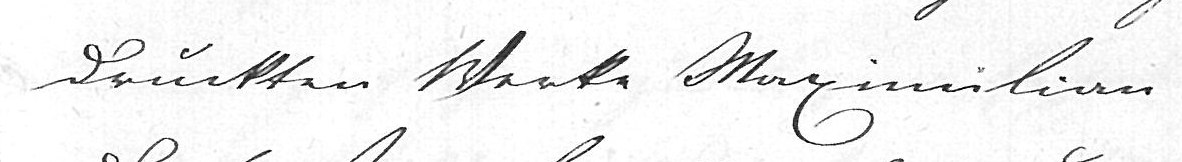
druckten Werken Maximilian
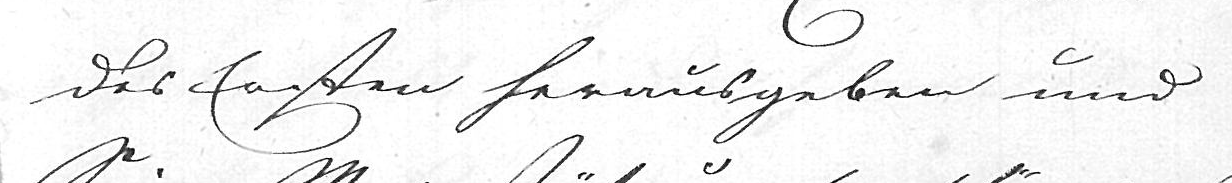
des Ersten herausgeben und
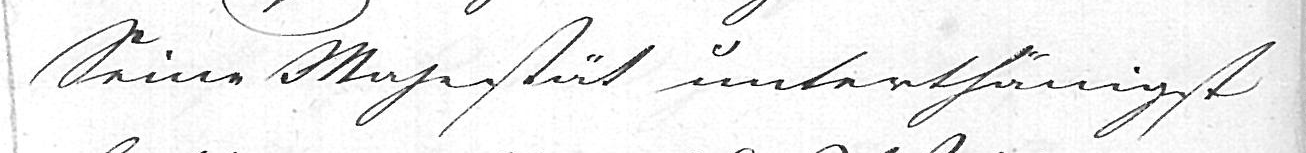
Seine Majestät unterthänigst
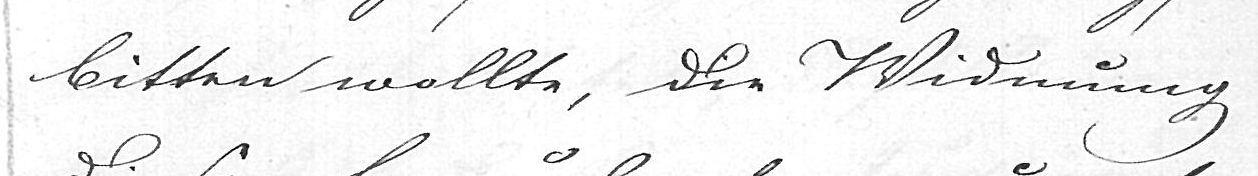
bitten wollte, die Widmung
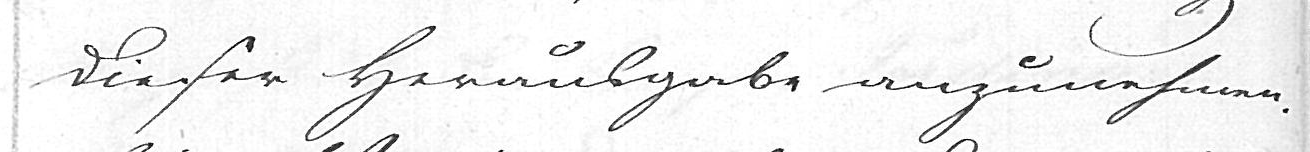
dieser Herausgabe anzunehmen.
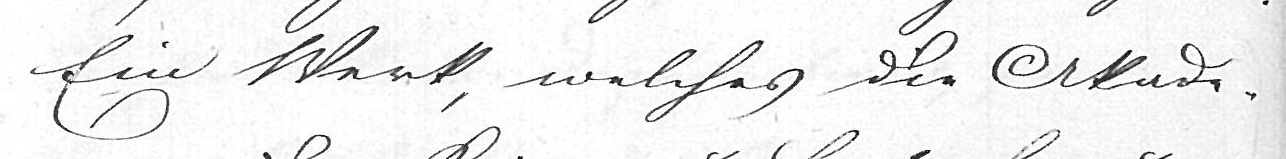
Ein Werk, welches die Akade-
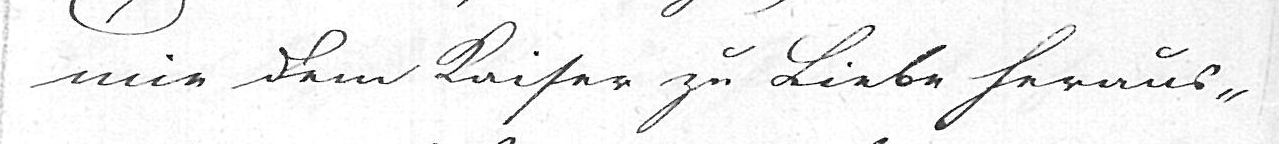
mie dem Kaiser zu Liebe heraus-
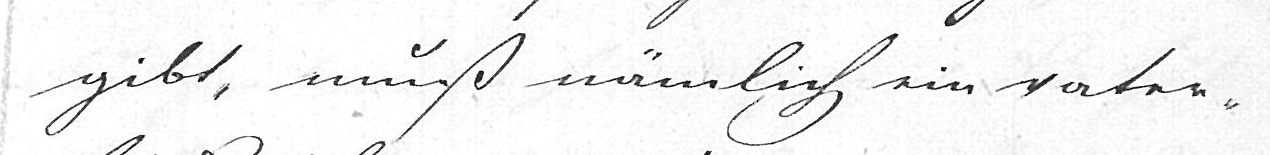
gibt, muß nämlich ein vater-
